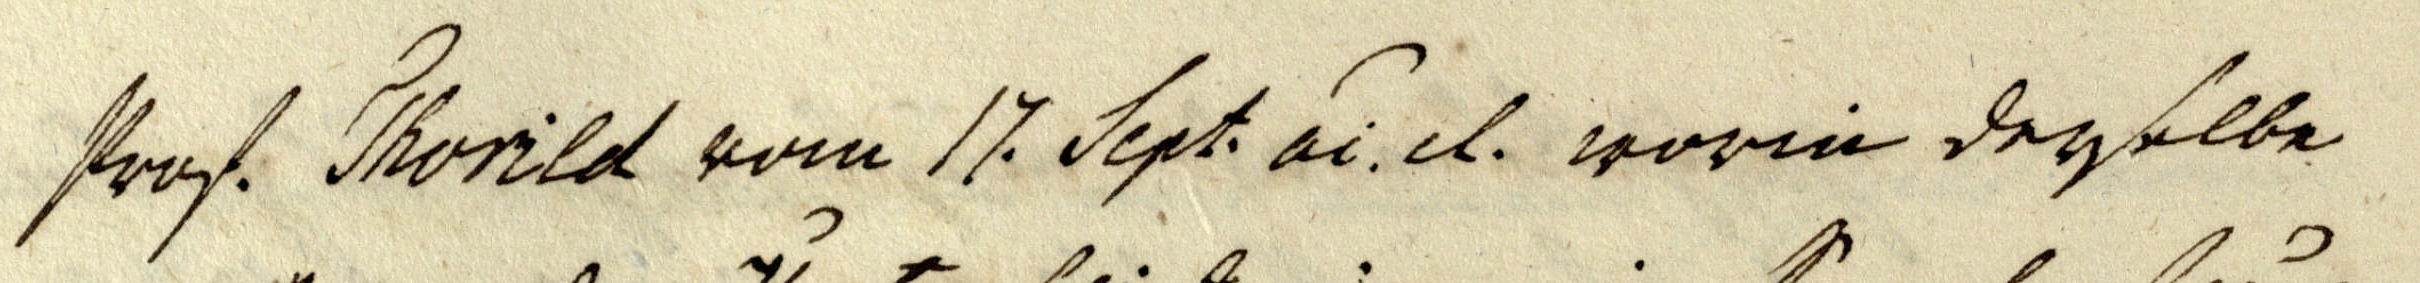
Prof. Thorild vom 17. Sept. ai. et. worin derselbe
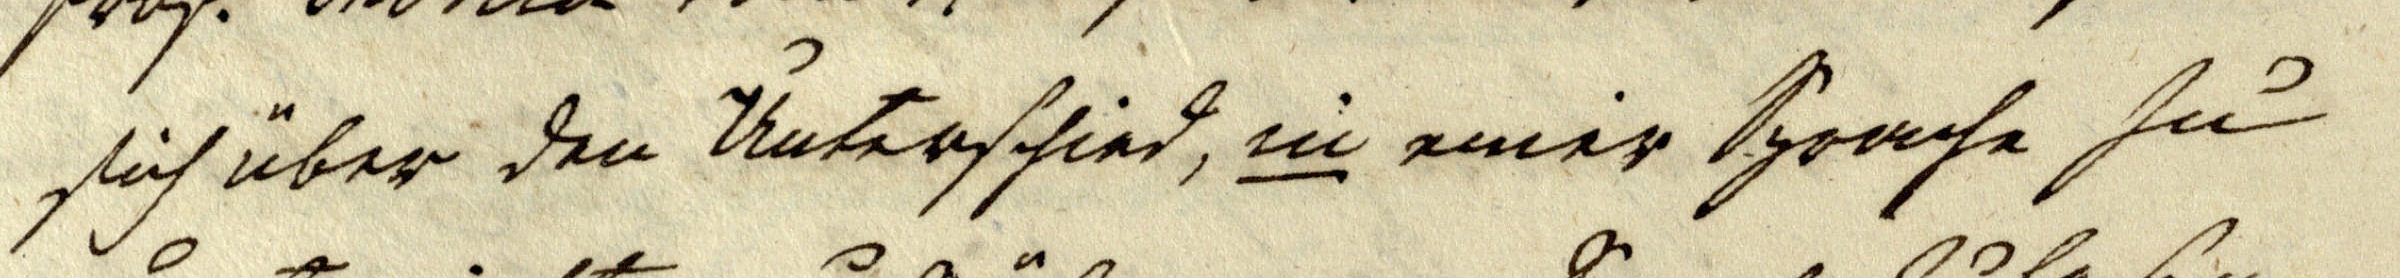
sich über den Unterschied, in einer Sprache zu
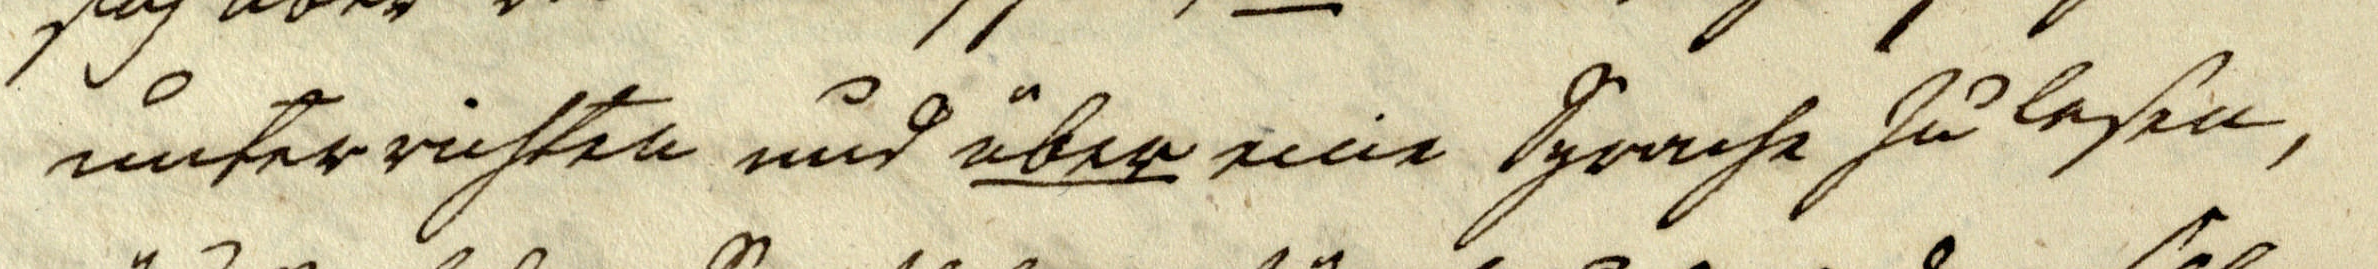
unterrichten und über eine Sprache zu lesen,
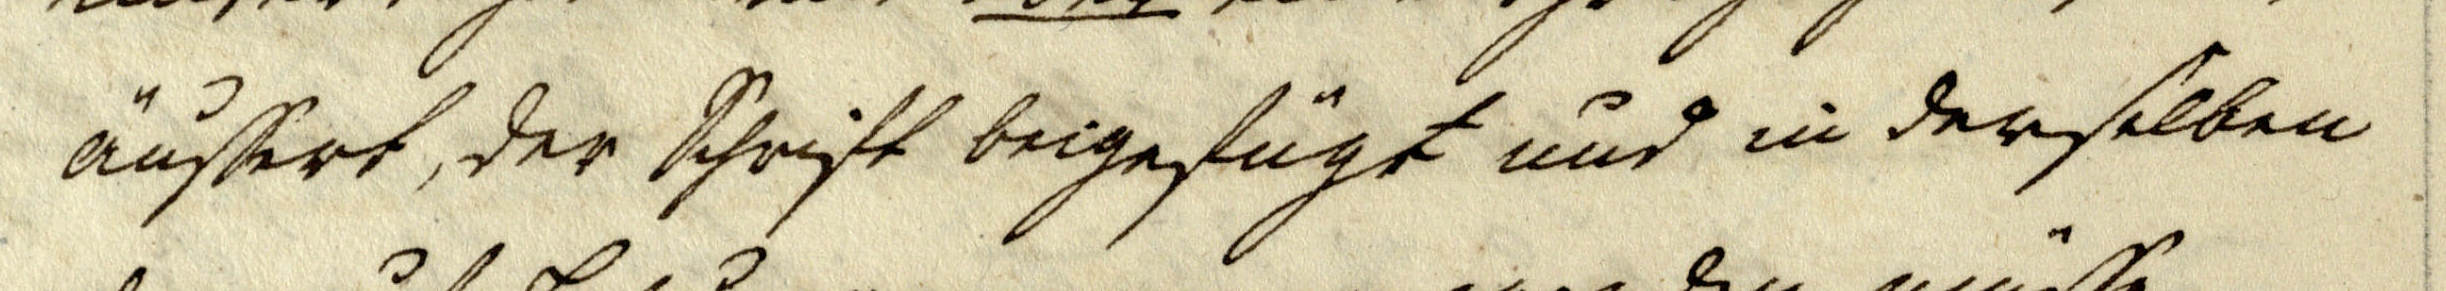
äussert, der Schrift beigefügt und in derselben
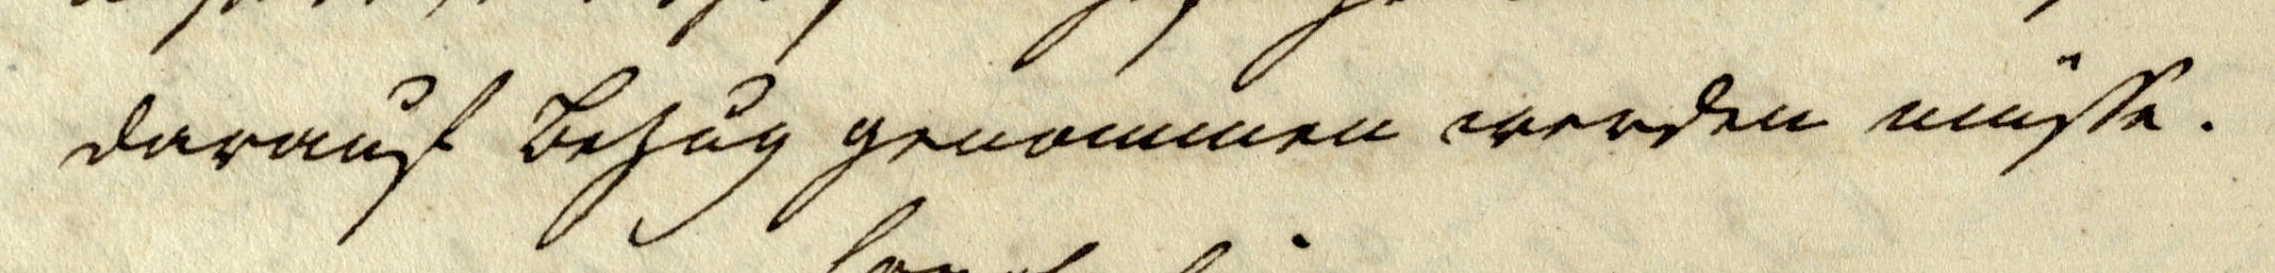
darauf Bezug genommen werden müsse.
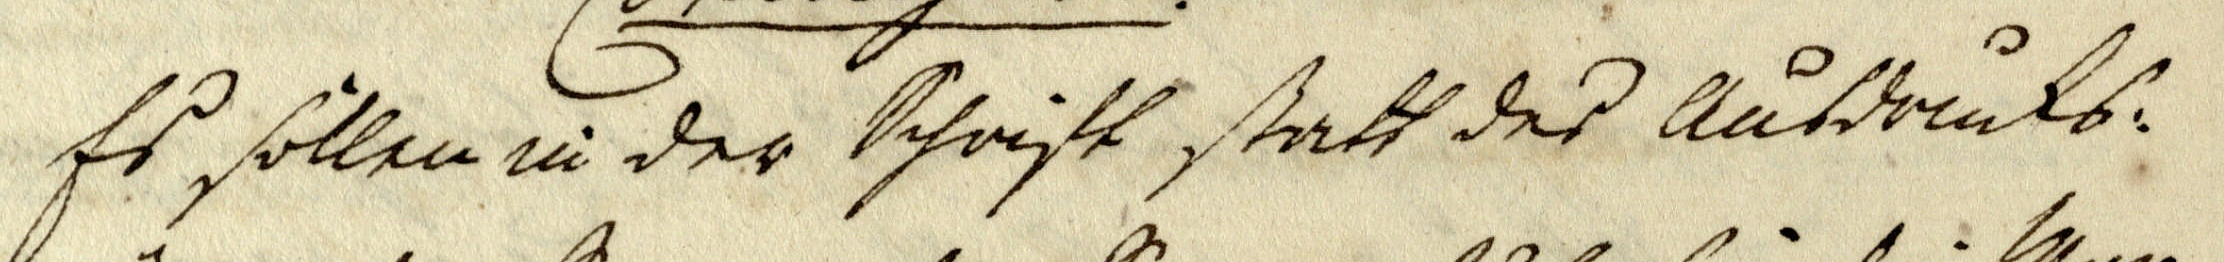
Es sollen in der Schrift statt des Ausdrucks:
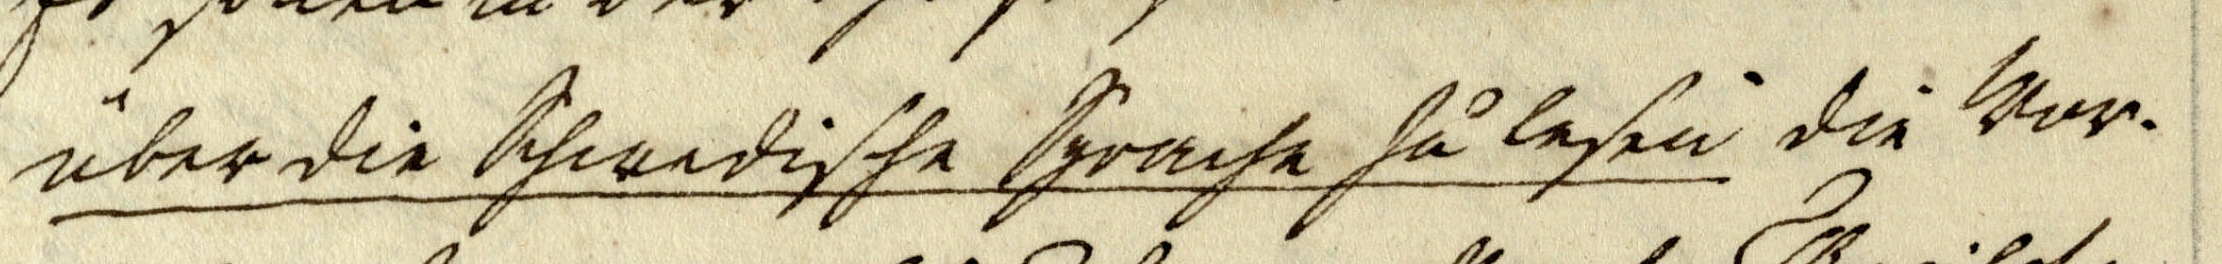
über die Schwedische Sprache zu lesen die Wor¬
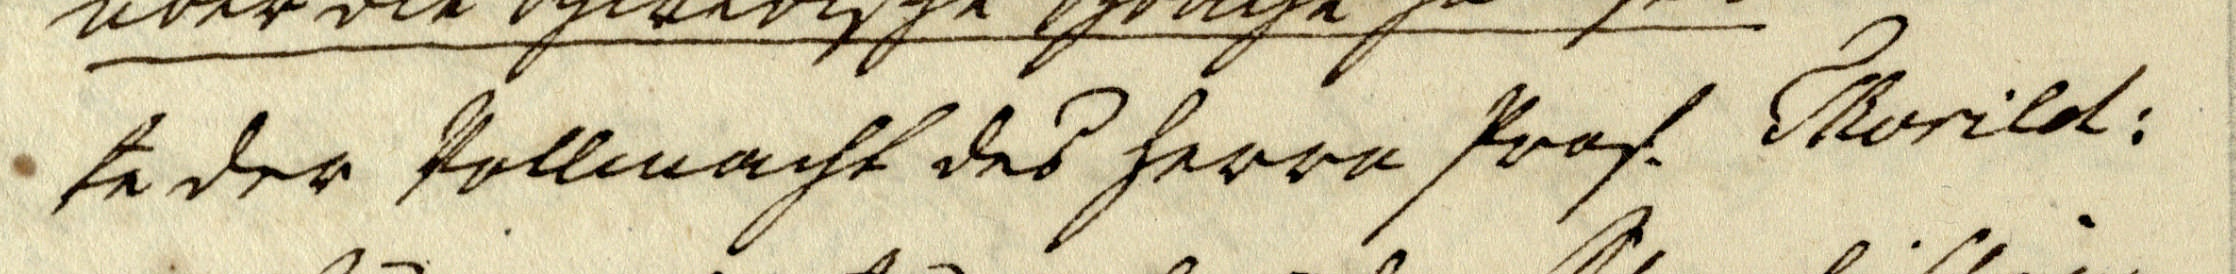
te der Vollmacht des Herrn Prof. Thorild:
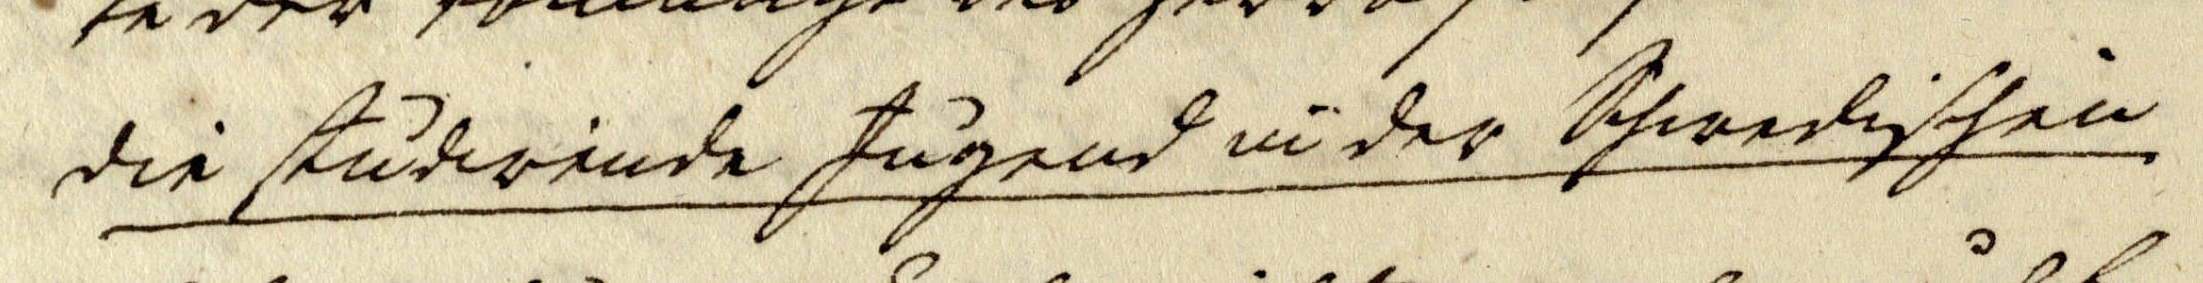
die studirende Jugend in der Schwedischen
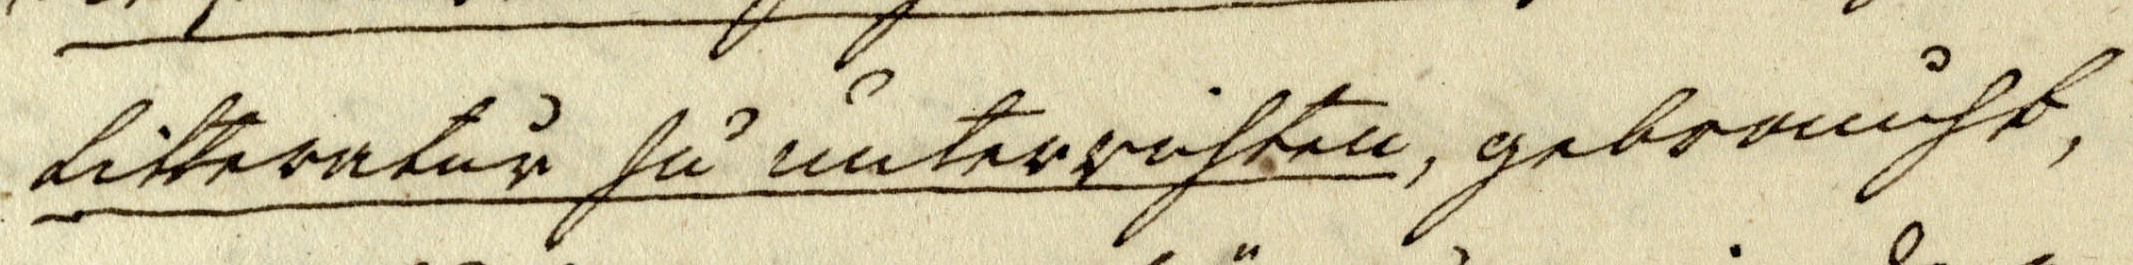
Litteratur zu unterrichten, gebraucht
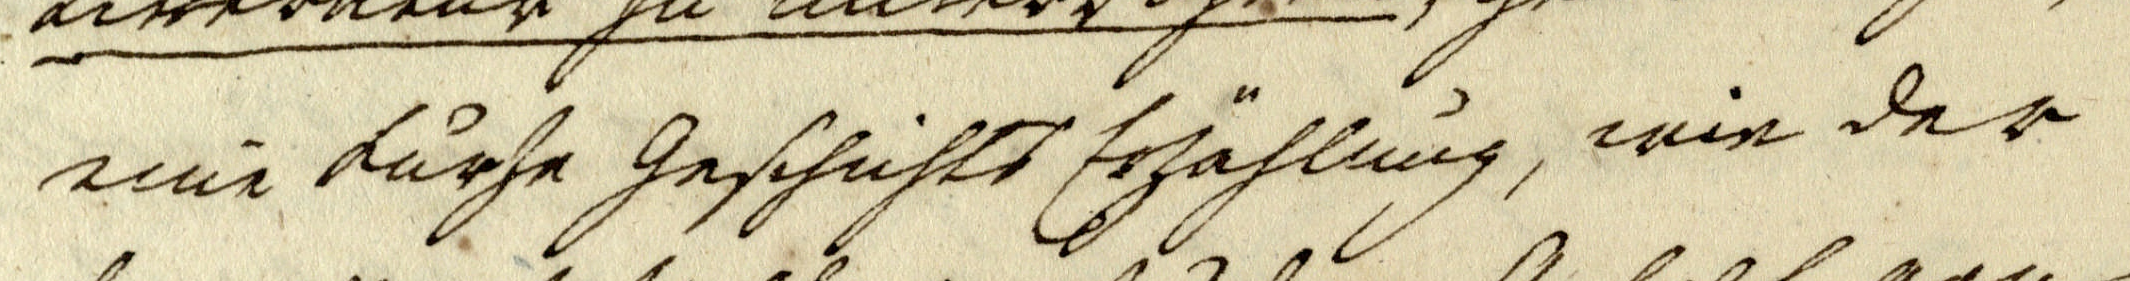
eine kurze Geschichts Erzählung, wie der
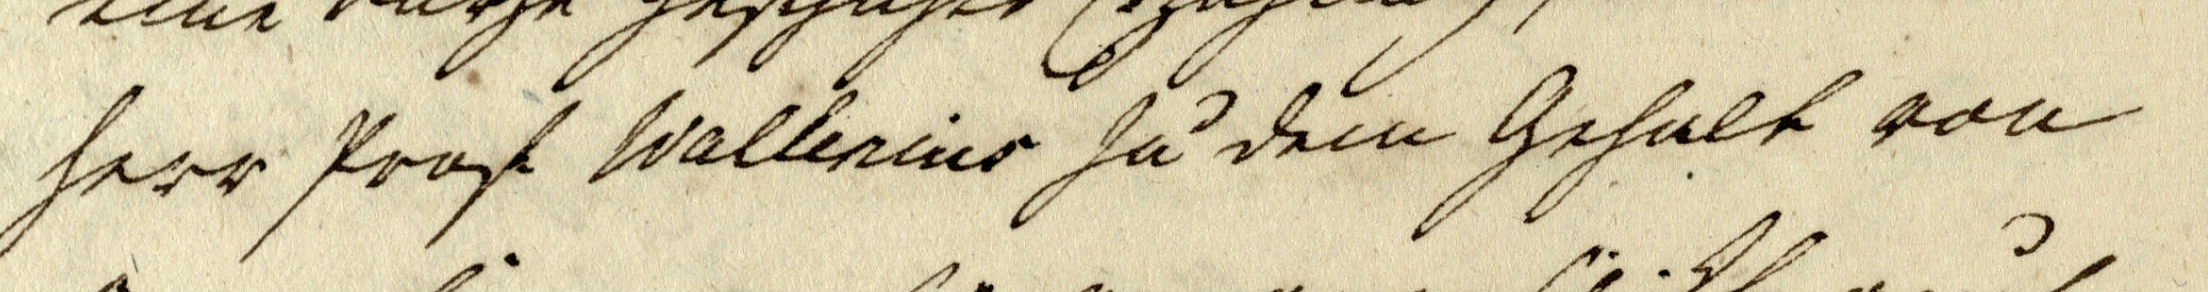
Herr Prof. Wallenius zu dem Gehalt von
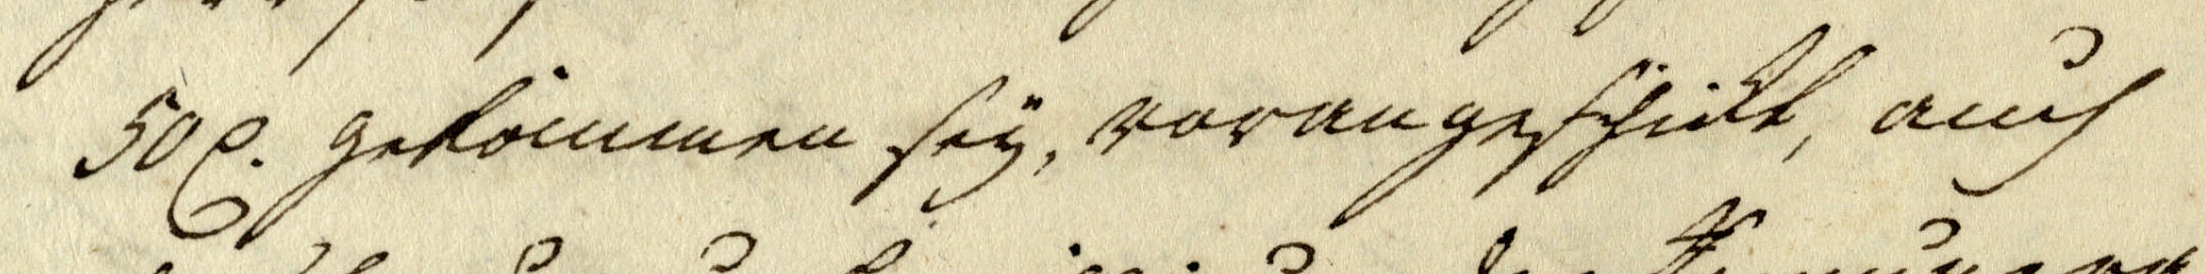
50 l. gekommen seÿ, vorangeschickt, auch
